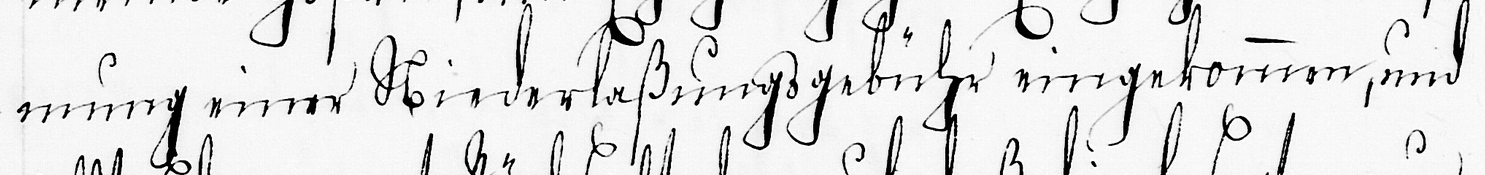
mmung einer Niederlaßungsgebühr eingekommen, und
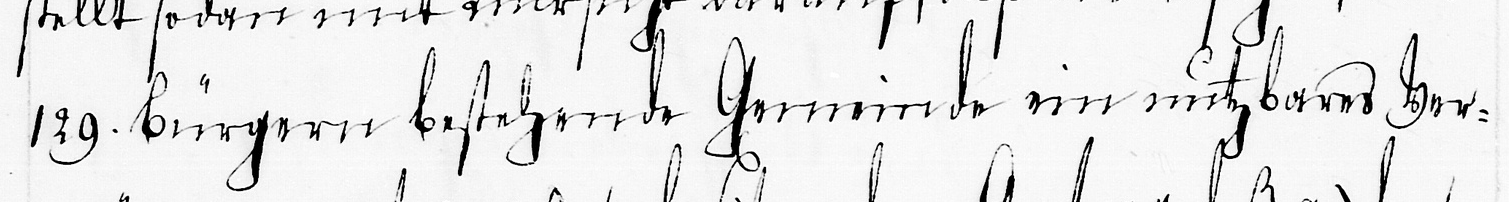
129. Bürgern bestehende Gemeinde ein nutzbares Ver¬
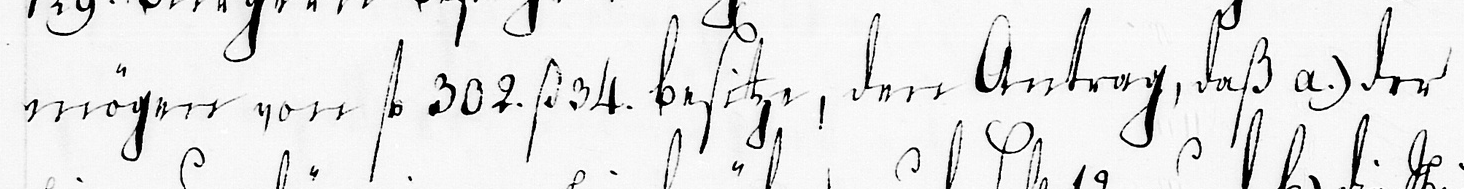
mögen von fl. 302. ß 34. besitze, den Antrag, daß a.) der
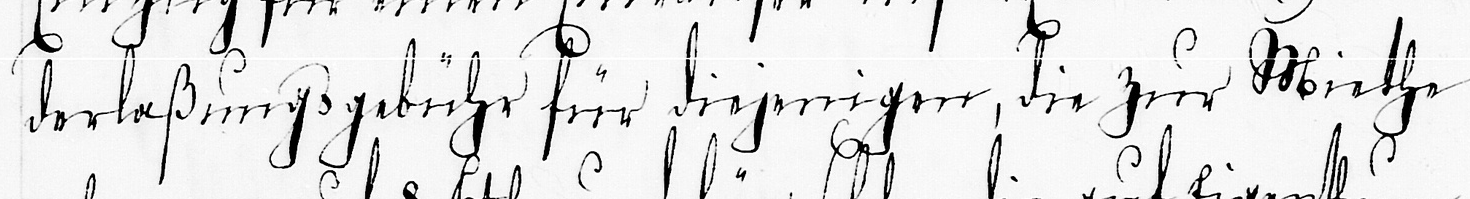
ederlaßungsgebühr für diejenigen, die zur Miethe
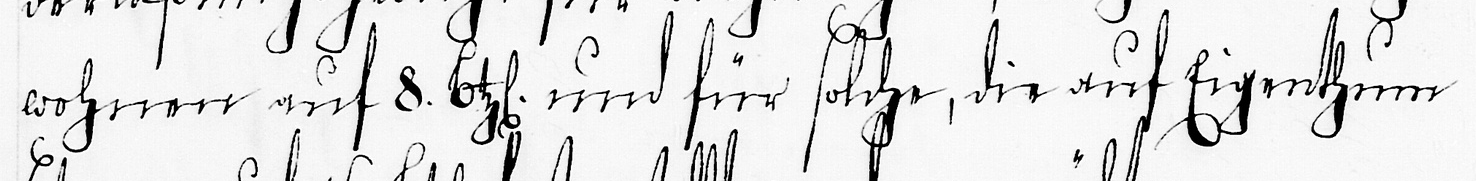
wohnen auf 8. Btz[en]. und für solche, die auf Eigenthum
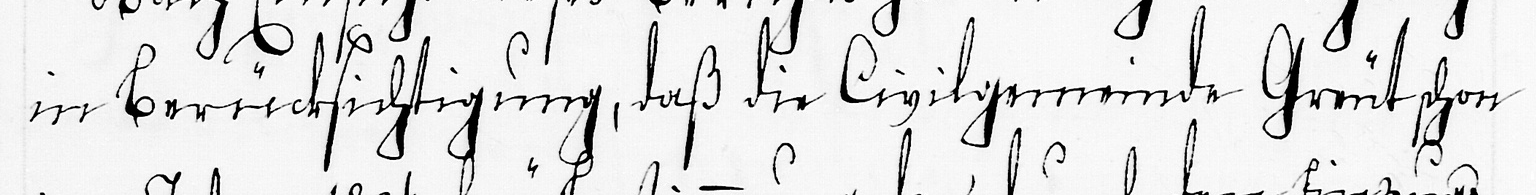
in Berücksichtigung, daß die Civilgemeinde Greut schon
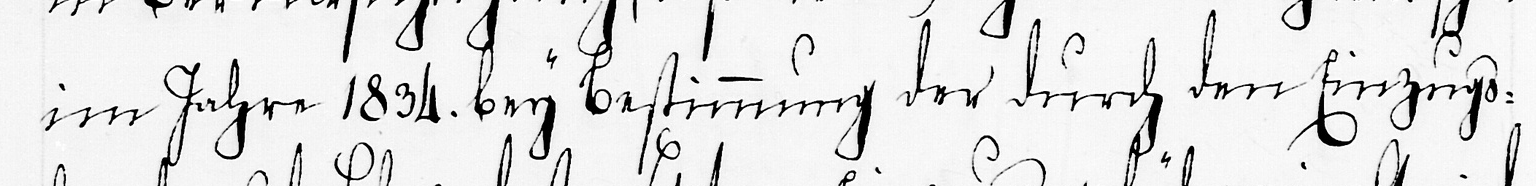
im Jahre 1834. bey Bestimmung der durch den Einzugs¬
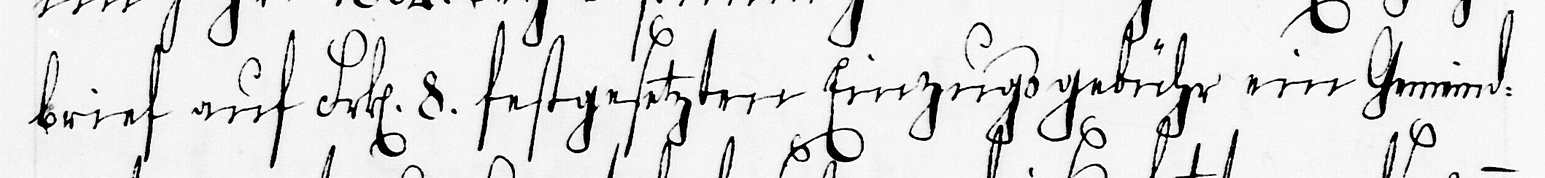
brief auf Frk[en]. 8. festgesetzten Einzugsgebühr ein Gemeind¬
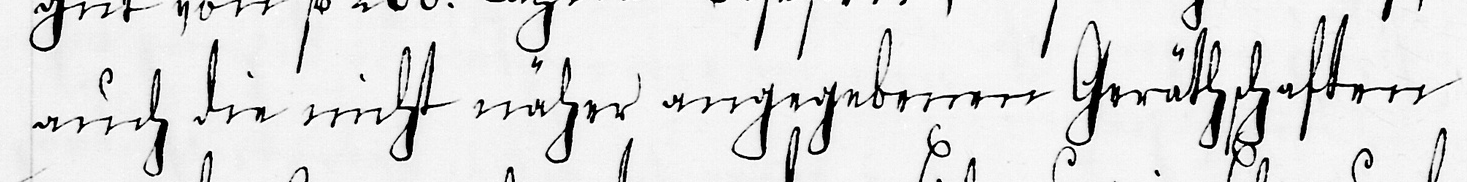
auch die nicht näher angegebenen Geräthschaften
